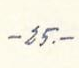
25
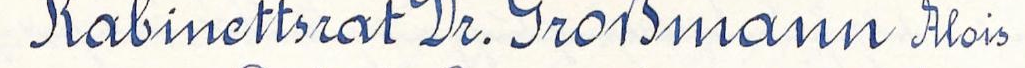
Kabinettsrat Dr. Großmann Alois
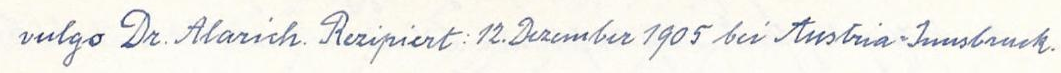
vulgo Dr. Alarich, Rezipiert 12. Dezember 1905 bei Austria-Innsbruck
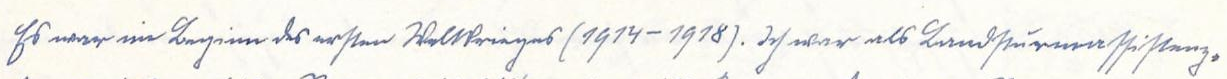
Es war im Beginn des ersten Weltkrieges (1914-1918). Ich war als Landsturmassistenz-
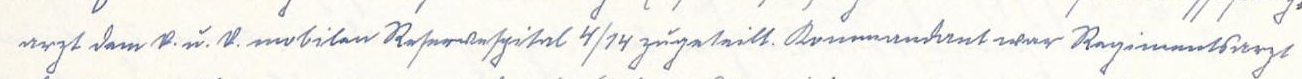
arzt dem k. u. k. Reservespital 4/14 zugeteilt. Kommandant war Regimentsarzt
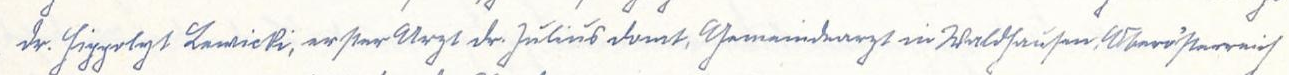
Dr. Hippolyt Lewicki, erster Arzt Dr. Julius Donat, Gemeindearzt in Waldhausen Oberösterreich
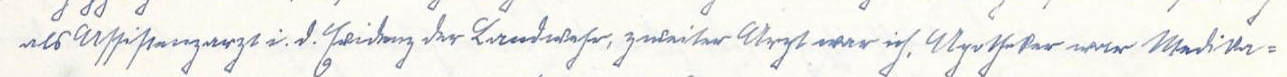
als Assistenzarzt i. d. Evidenz der Landwehr zweiter Arzt war ich, Apotheker war Medika-
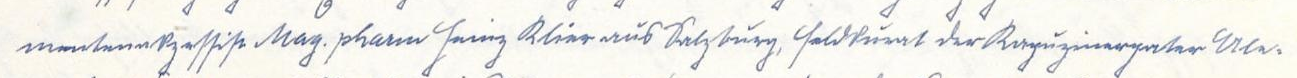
mentenakzessist Mag. pharm Heinz Klier aus Salzburg, Feldkurat der Kapuzinerpater Ale-
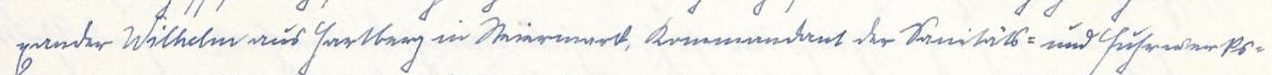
xander Wilhelm aus Hartberg in Steiermark, Kommandant der Sanitäts- und Fuhrwerks-
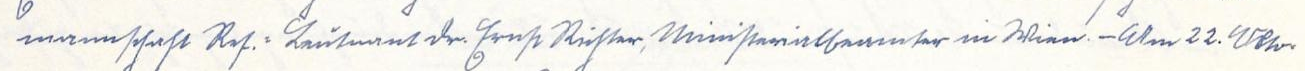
mannschaft Res.-Leutnant Dr. Ernst Richter, Ministerialbeamter in Wien.- Am 22. Okto-
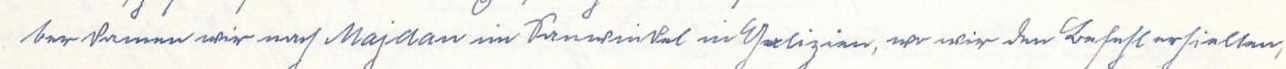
ber kamen wir nach Majdan im Sanwinkel in Galizien wo wir den Befehl erhielten,
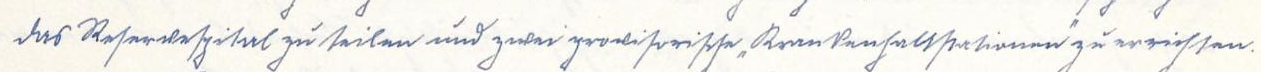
das Reservespital zu teilen und zwei provisorische „Krankhaltstationen“ zu errichten.
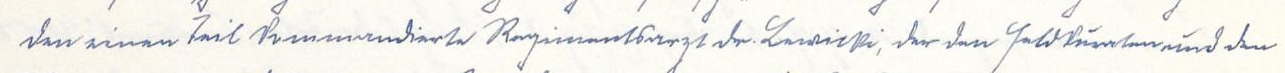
Den einen Teil kommandierte Regimentsarzt Dr. Lewicki, der den Feldkuraten und den
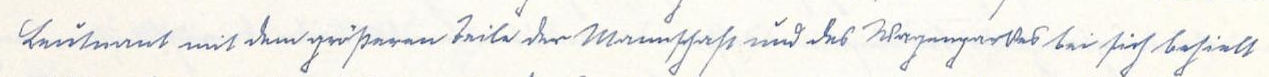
Leutnant mit dem größeren Teile der Mannschaft und des Wagenparks bei sich behielt
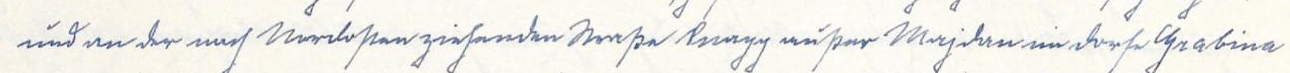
und an der nach Nordosten ziehenden Straße knapp außer Majdan im Dorfe Grabina
